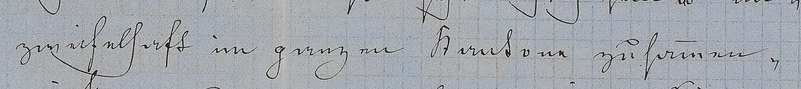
zweifelhaft im ganzen Kantone zusammen-
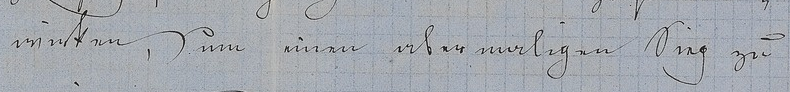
wirken, um einen abermaligen Sieg zu
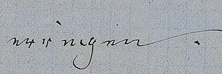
erringen.
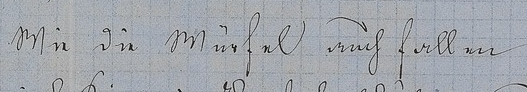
Wie die Würfel auch fallen
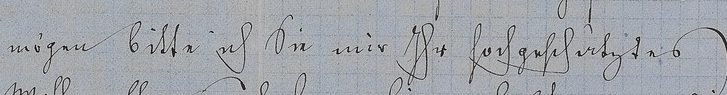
mögen bitte ich Sie mir Ihr hochgeschätztes
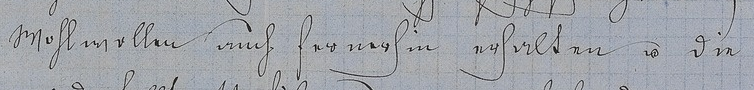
Wohlwollen auch fernerhin erhalten & die
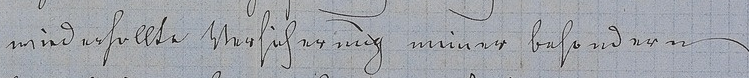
wiederhollte Versicherung meiner besondern
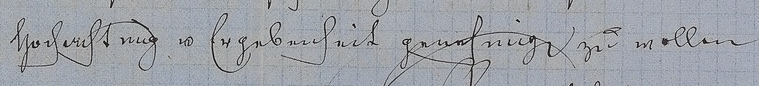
Hochachtung & Ergebenheit genehmigen zu wollen.
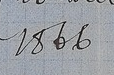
20. Decbr
